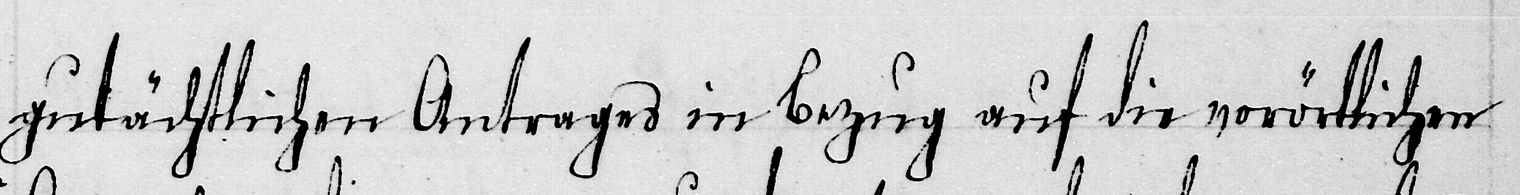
gutächtlichen Antrages in Bezug auf die vorörtlichen
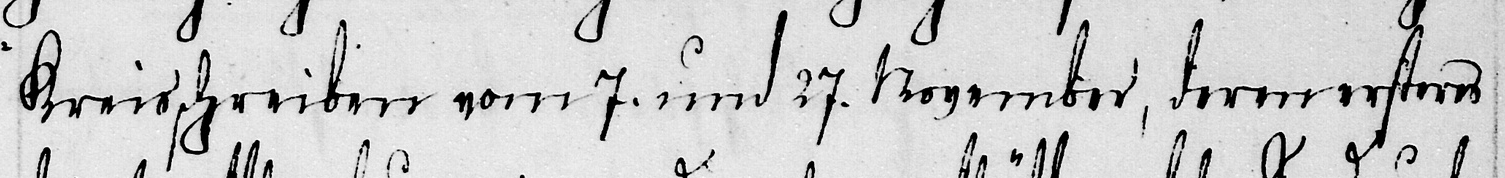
Kreisschreiben vom 7. und 27. November, deren ersteres
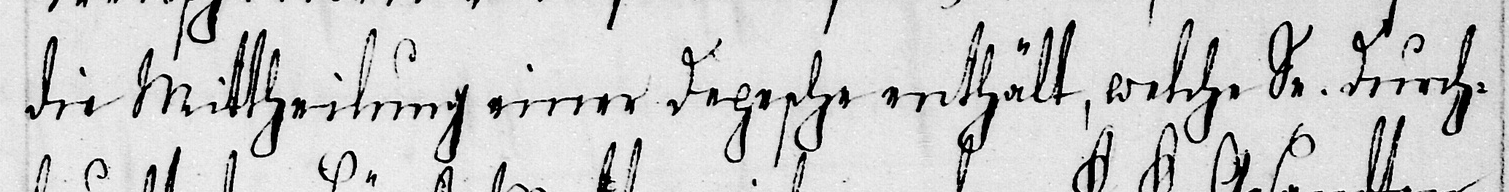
die Mittheilung einer Depesche enthält, welche Se. Durch¬
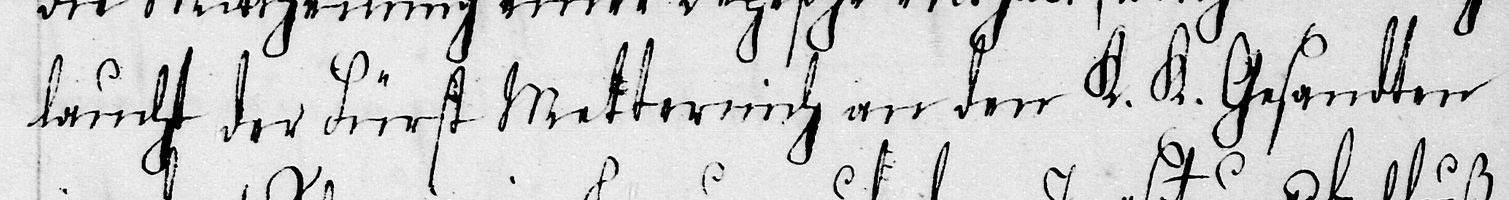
laucht der Fürst Metternich an den K. K. Gesandten
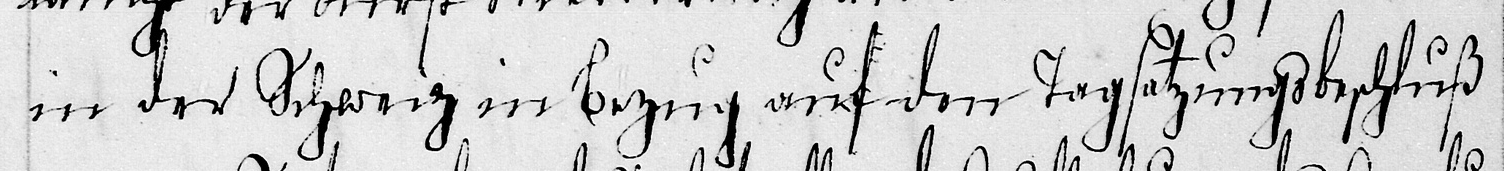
in der Schweiz in Bezug auf den Tagsatzungsbeschluß
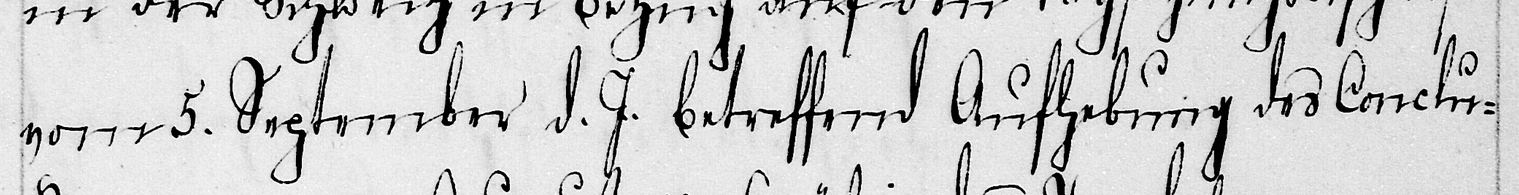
vom 5. September d. J. betreffend Aufhebung des Conclu¬
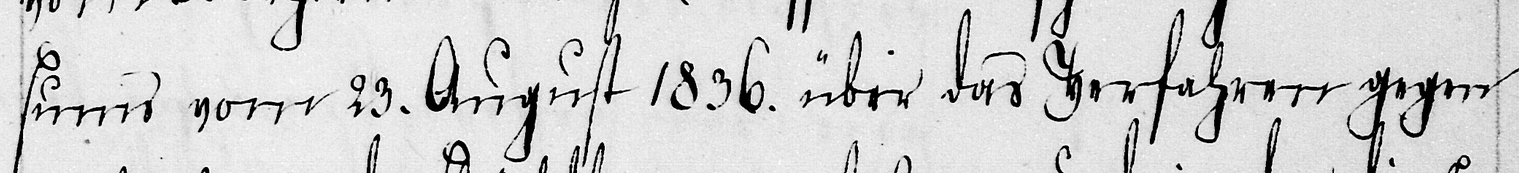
sums vom 23. August 1836. über das Verfahren gegen
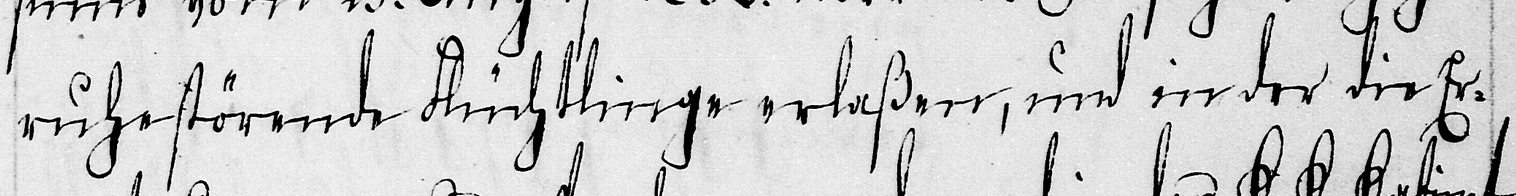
ruhestörende Flüchtlinge erlaßen, und in der die Er¬
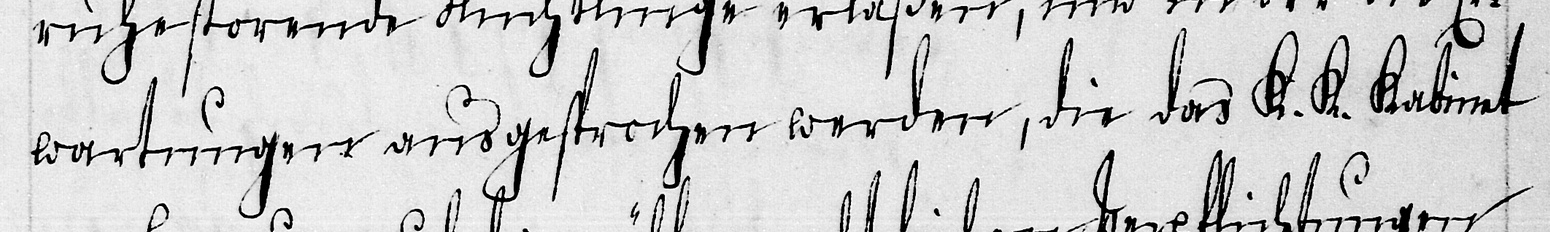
wartungen ausgesprochen werden, die das K. K. Kabinet
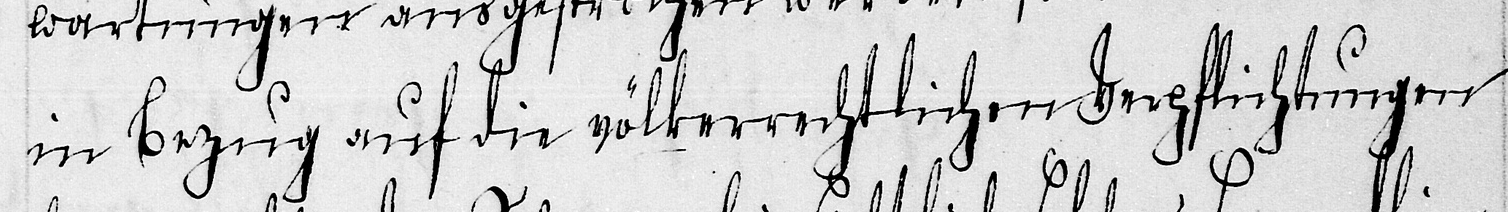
in Bezug auf die völkerrechtlichen Verpflichtungen
